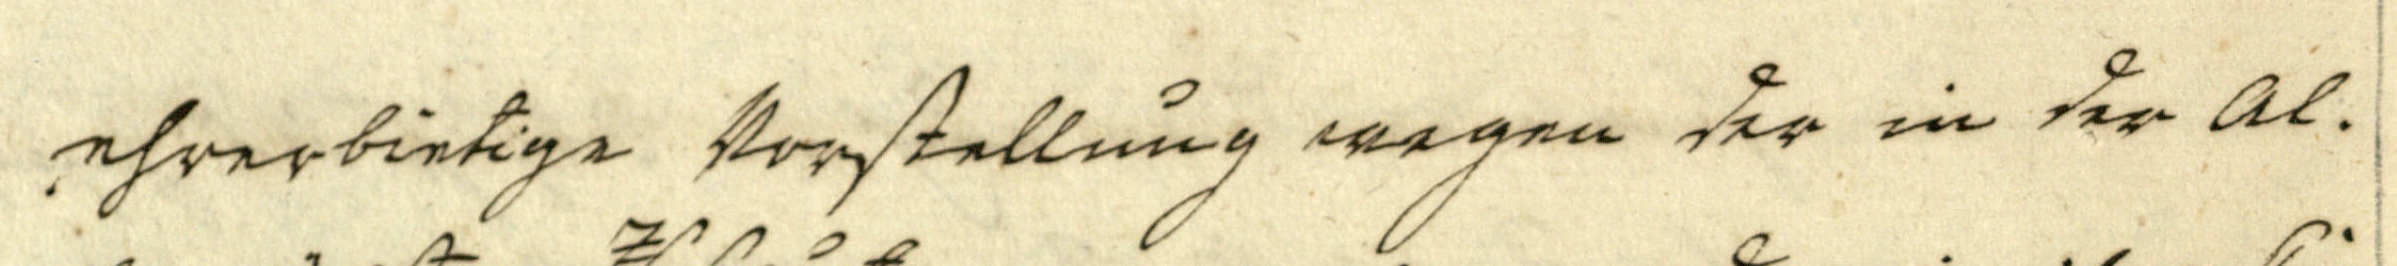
ehrerbietige Vorstellung wegen der in der Al¬
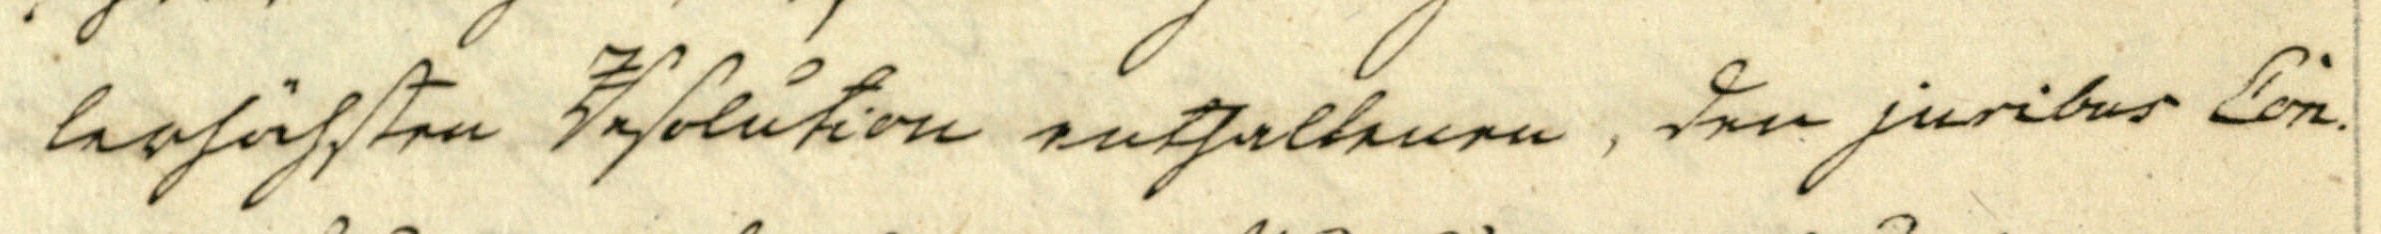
lerhöchsten Resolution enthaltenen, den juribus Con¬
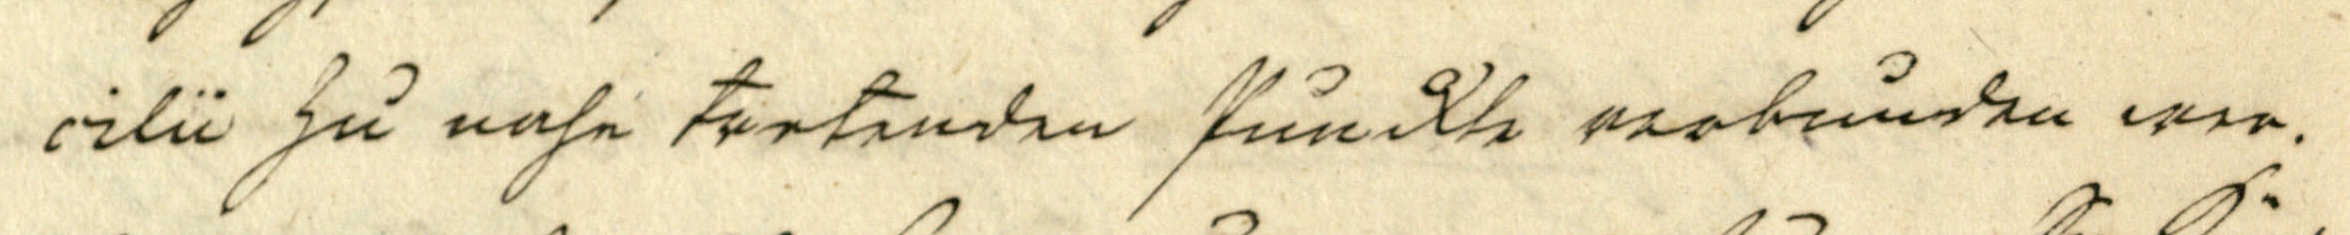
cilii zu nahe tretenden Punckte verbunden wer¬
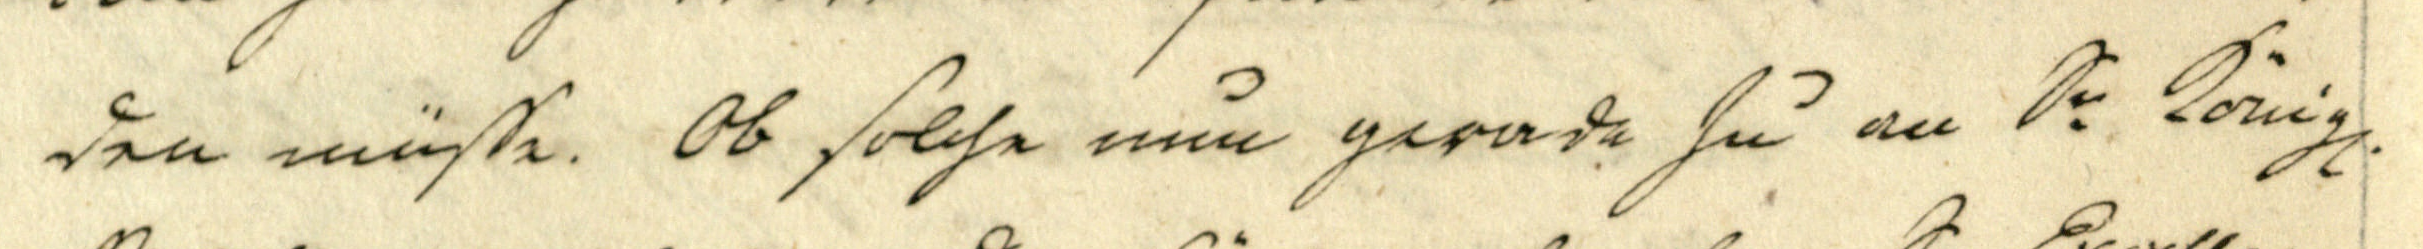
den müsse. Ob solche nun gerade zu an Sr Königl.
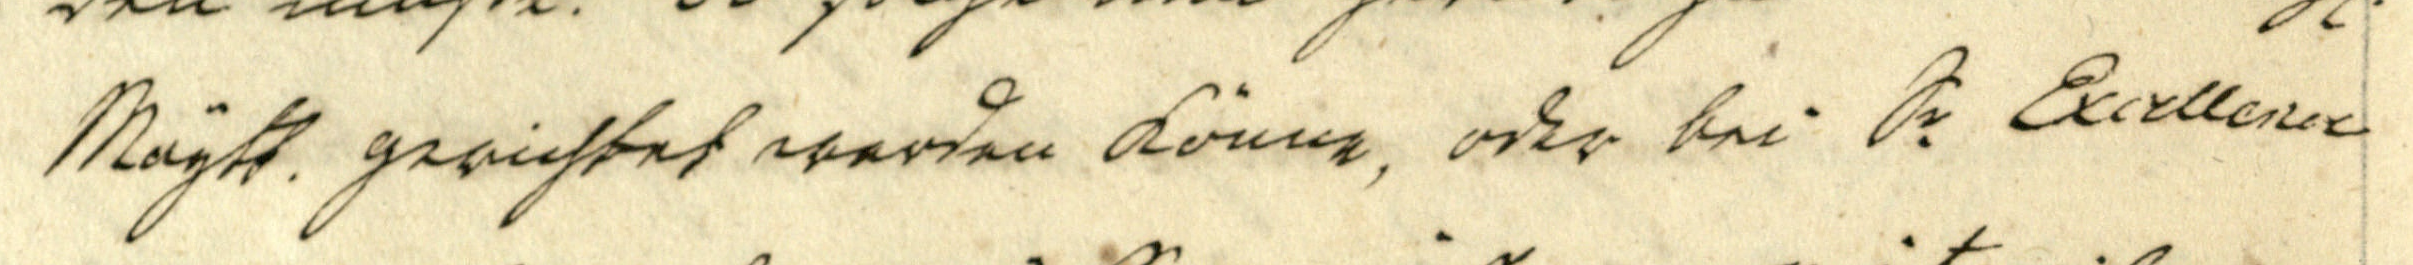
Maÿtt. gerichtet werden könne, oder bei Sr Excellence
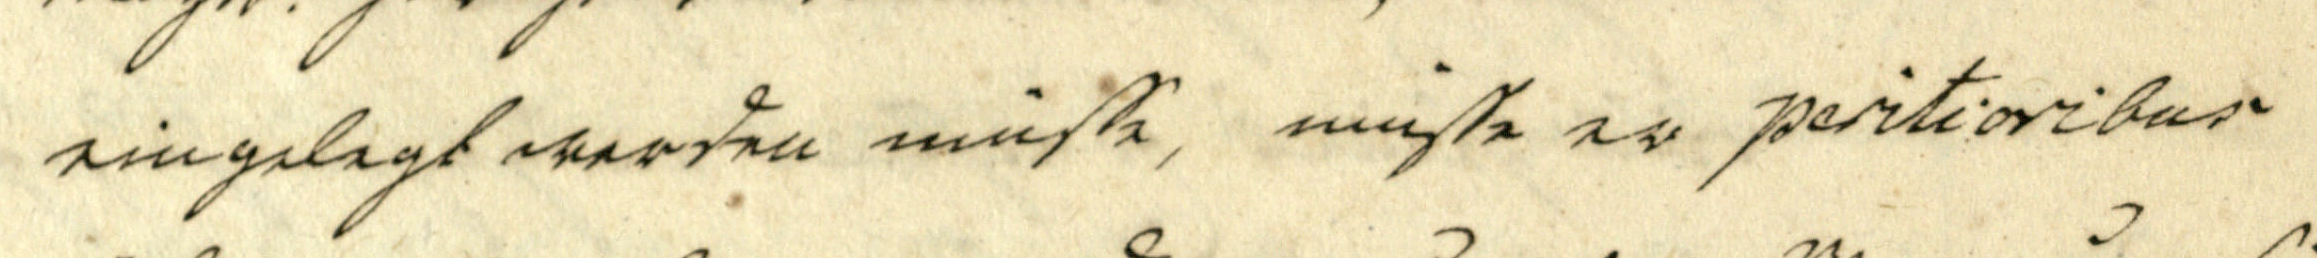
eingelegt werden müsse, müsse er peritioribus
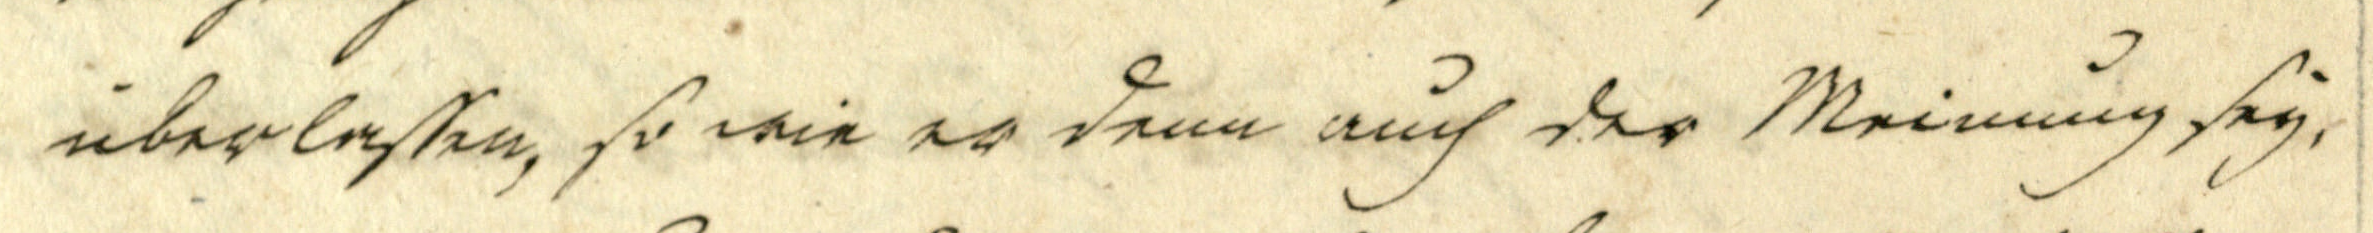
überlassen, so wie er denn auch der Meinung seÿ,
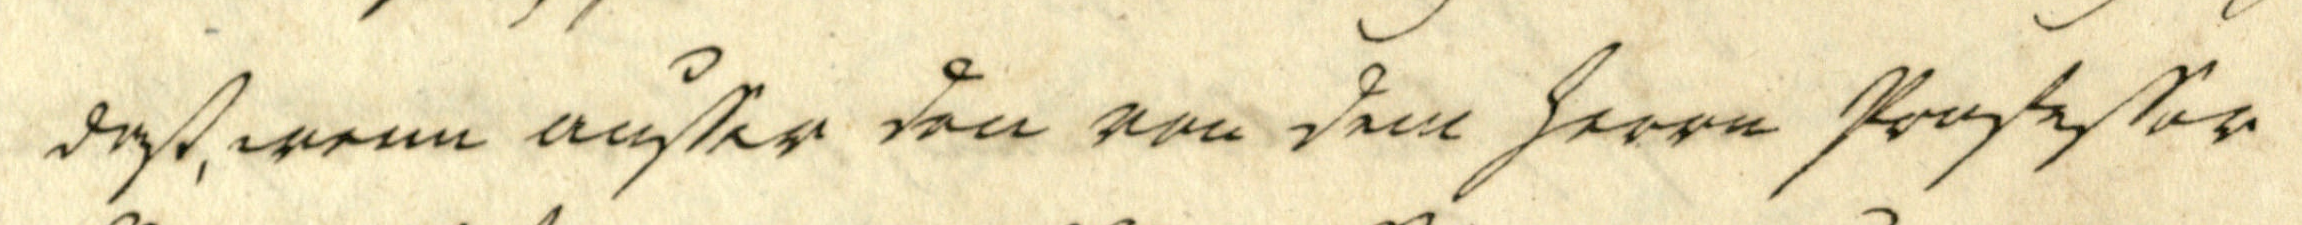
daß, wenn ausser den von dem Herrn Professor
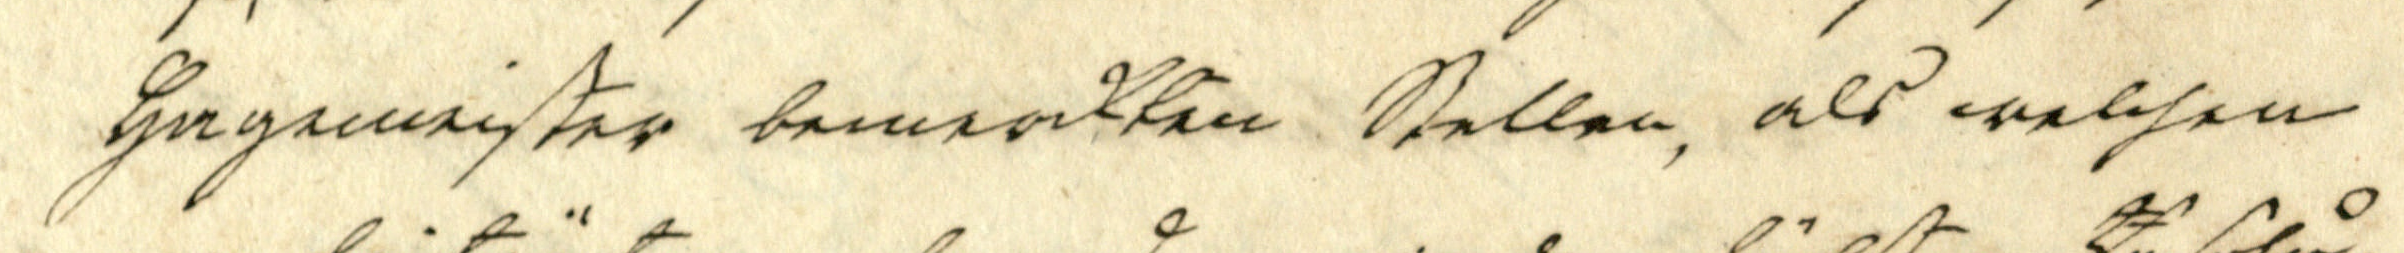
Hagemeister bemerckten Stellen, als welchen
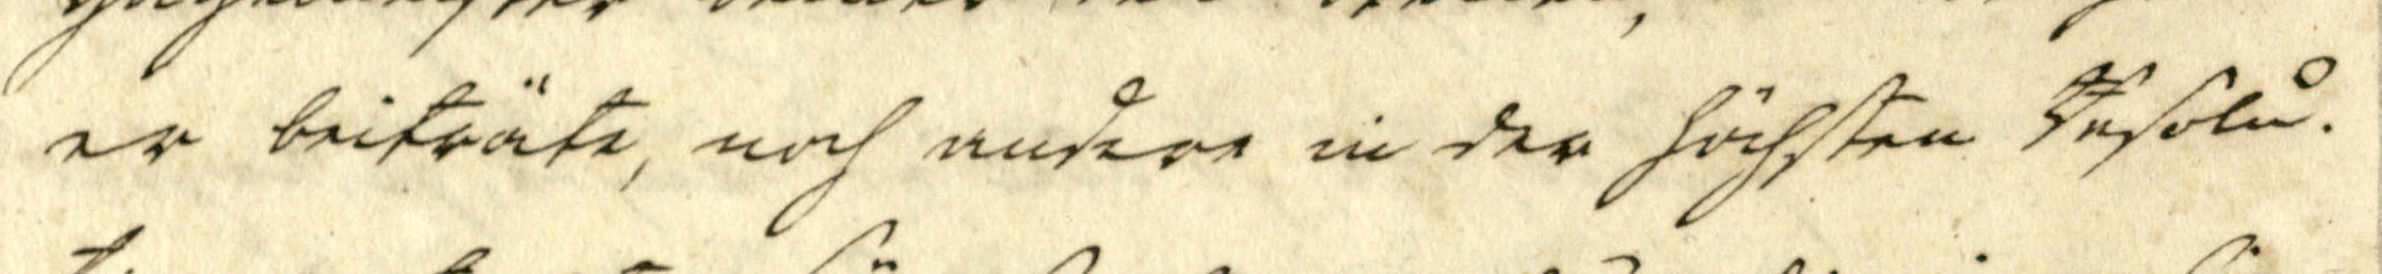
er beiträte, noch andere in der höchsten Resolu¬
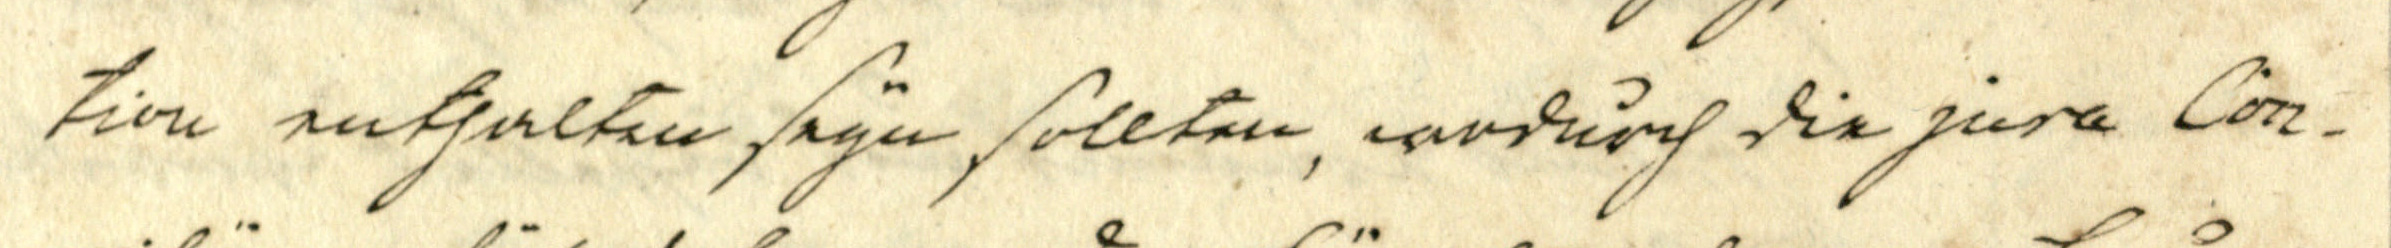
tion enthalten seÿn sollten, wodurch die jura Con¬
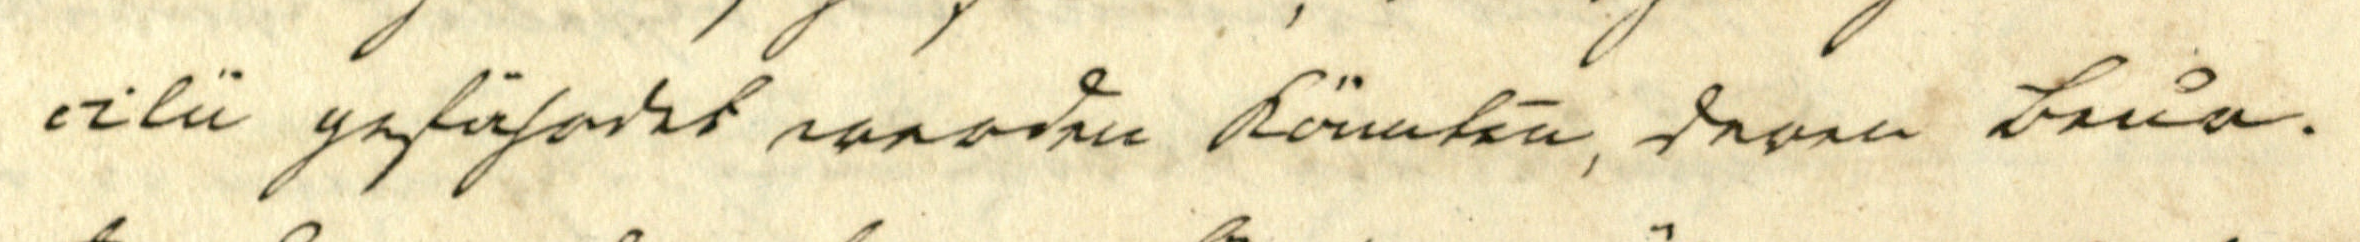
cilii gefährdet werden könnten, deren Beur¬
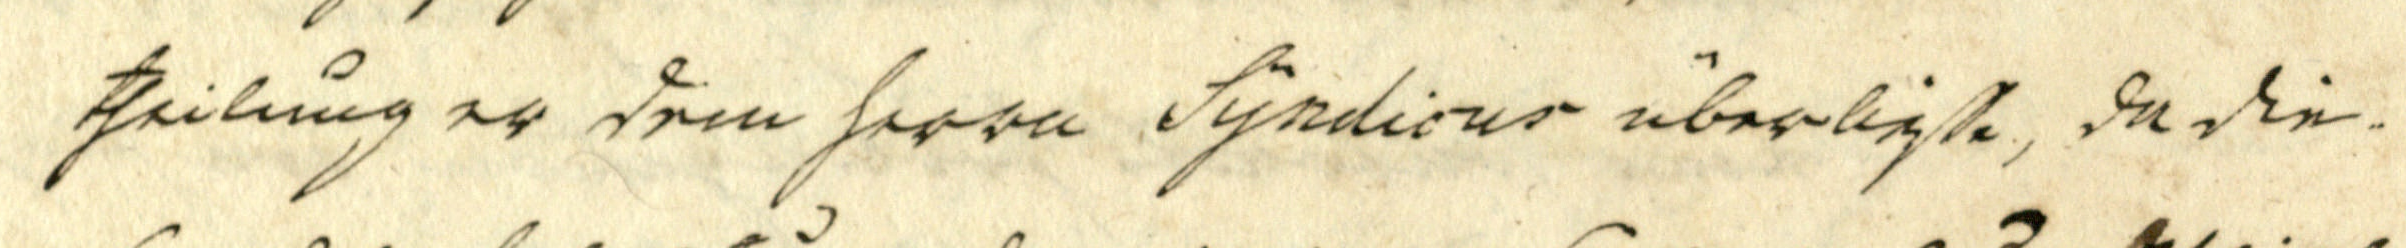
theilung er dem Herrn Sÿndicus überliesse, da die¬
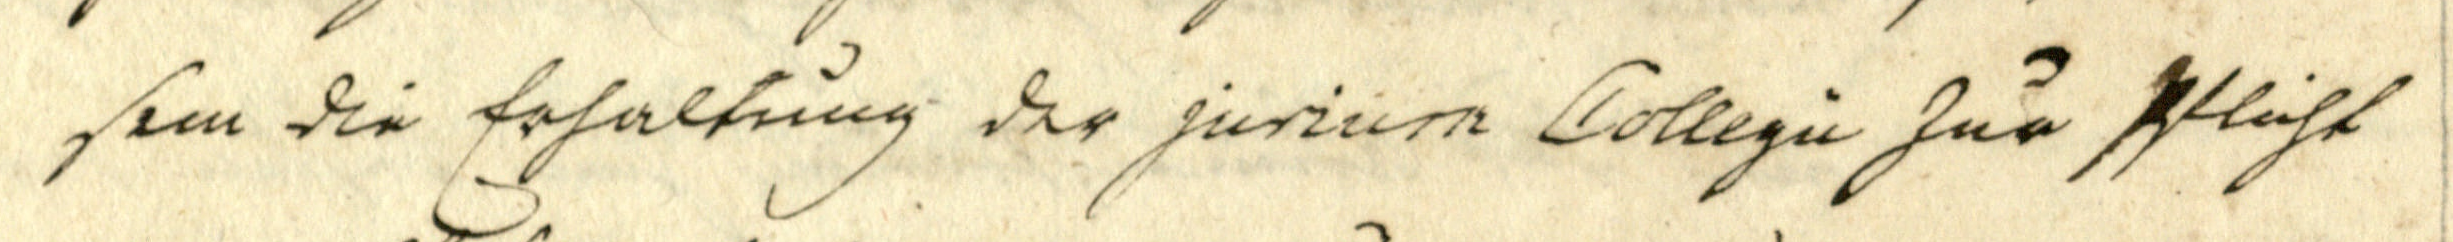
sem die Erhaltung der jurium Collegii zur Pflicht
